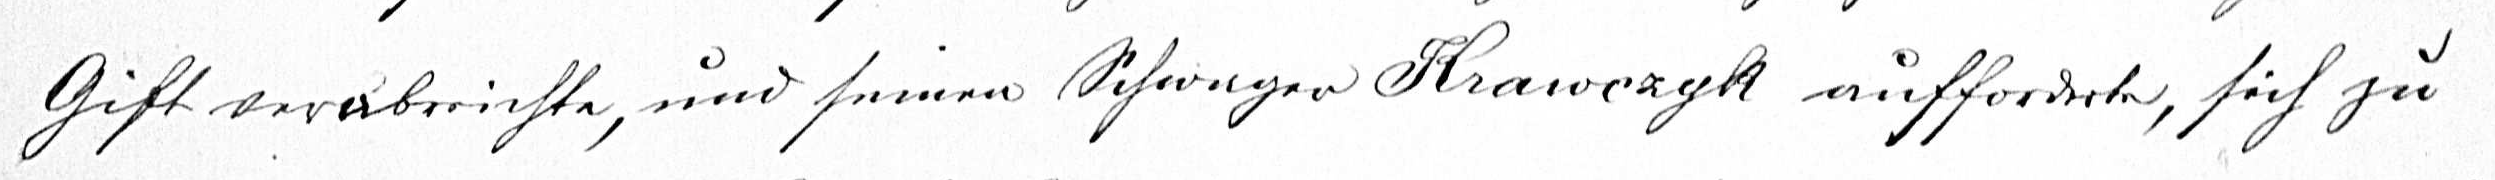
Gift verabreichte, und seinen Schwager Krawczyk aufforderte, sich zu
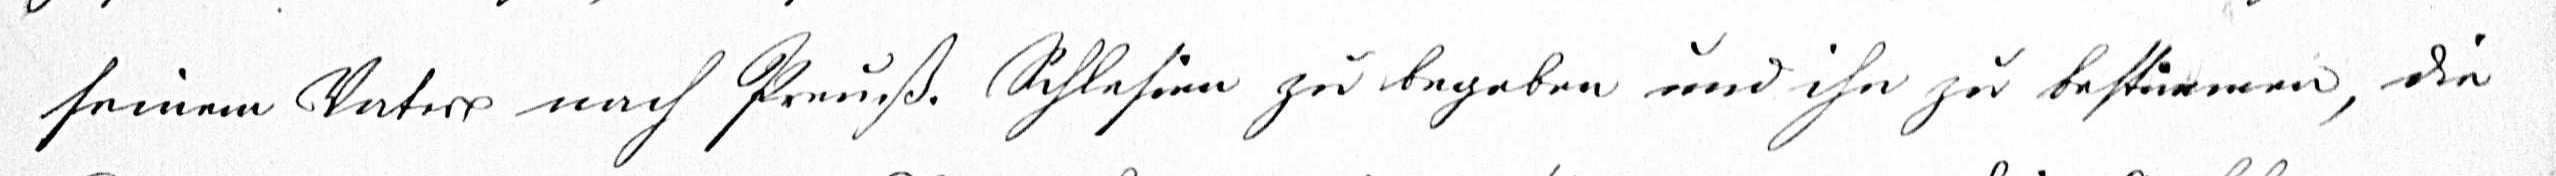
seinem Vater nach Preuß. Schlesien zu begeben und ihn zu bestimmen, die
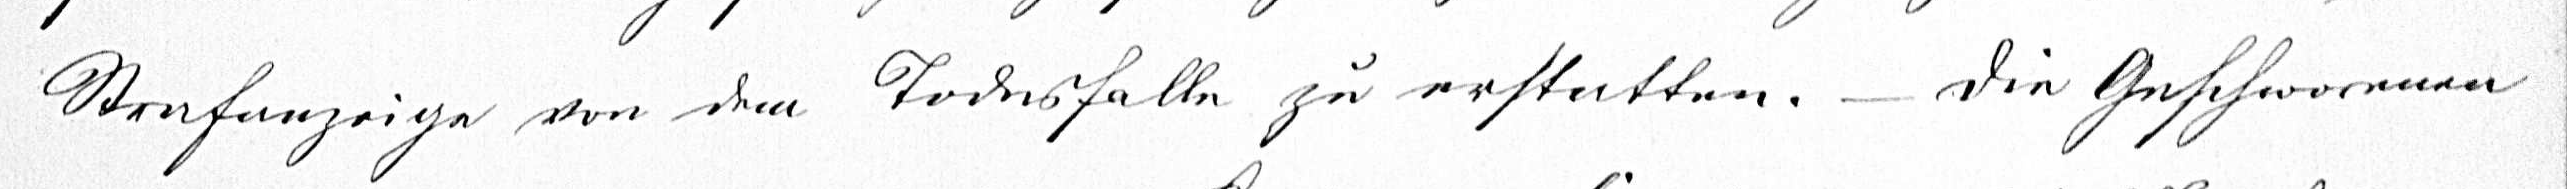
Strafanzeige von dem Todesfalle zu erstatten. Die Geschworenen
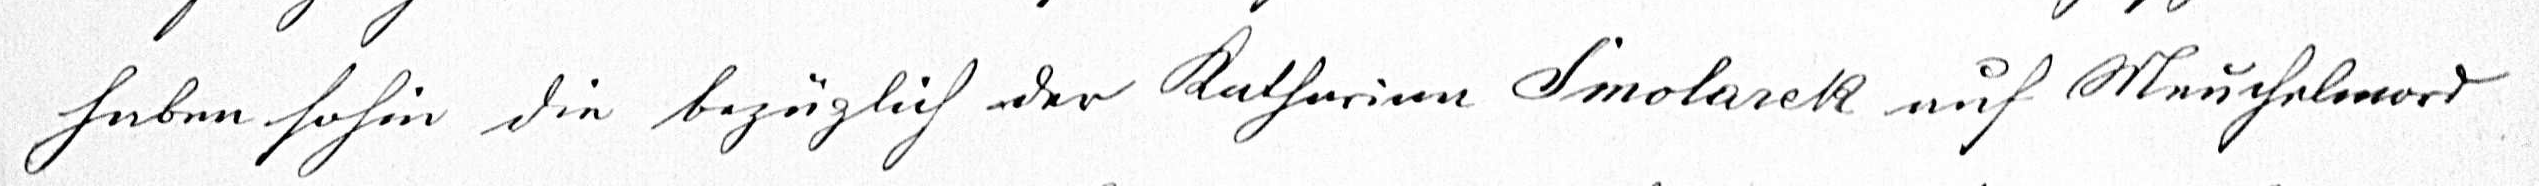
haben sohin die bezüglich der Katharina Smolarek auf Meuchelmord
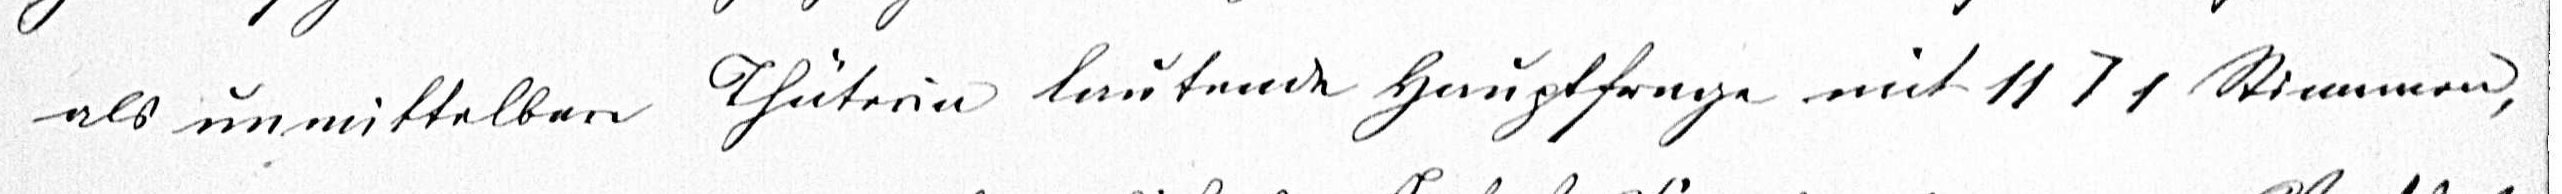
als unmittelbare Thäterin lautende Hauptfrage mit 11>1 Stimmen,
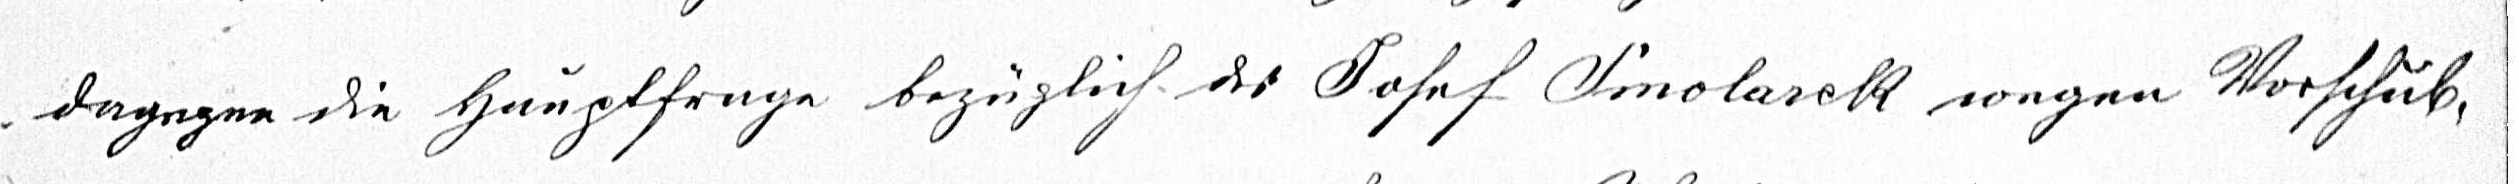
dagegen die Hauptfrage bezüglich den Josef Smolarek wegen Vorschub¬
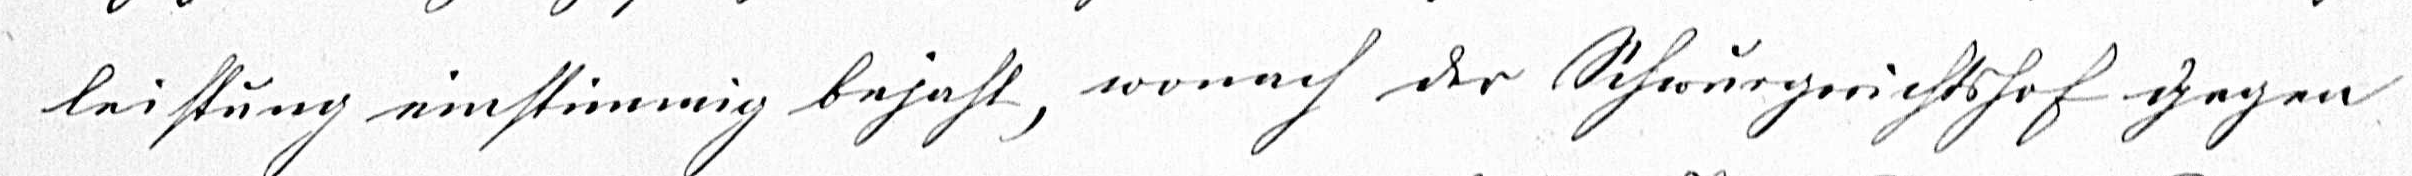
leistung einstimmig bejaht, wonach der Schwurgerichtshof gegen
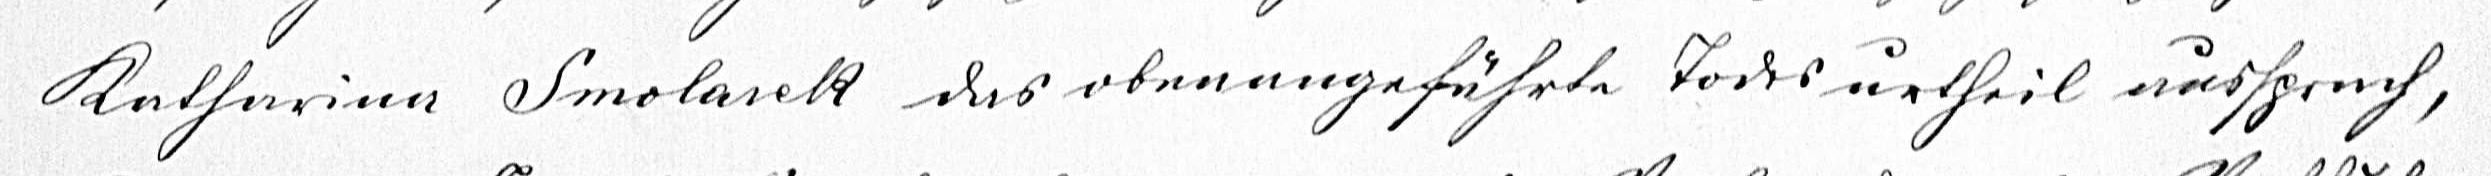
Katharina Smolarek das obenangeführte Todesurtheil aussprach,
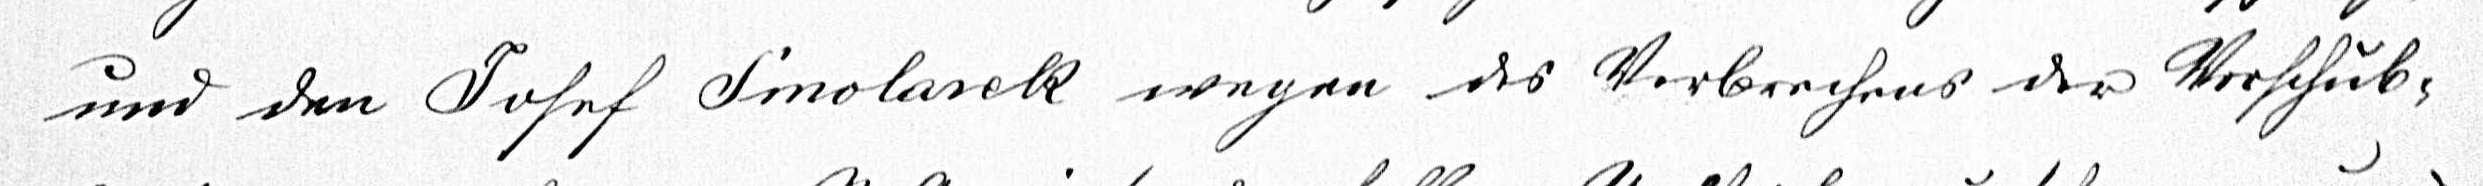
und den Josef Smolarek wegen des Verbrechens der Voschub¬
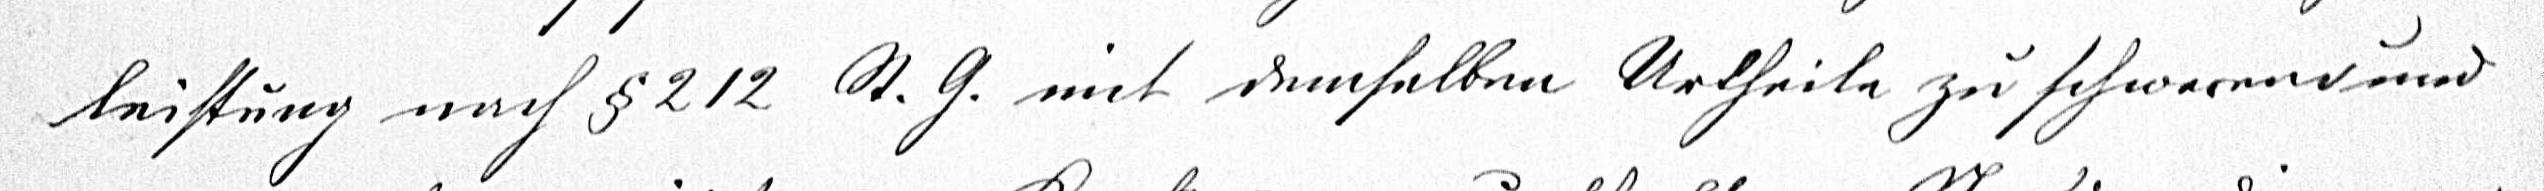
leistng nach §212 St. G. mit demselben Urtheile zu schweren und
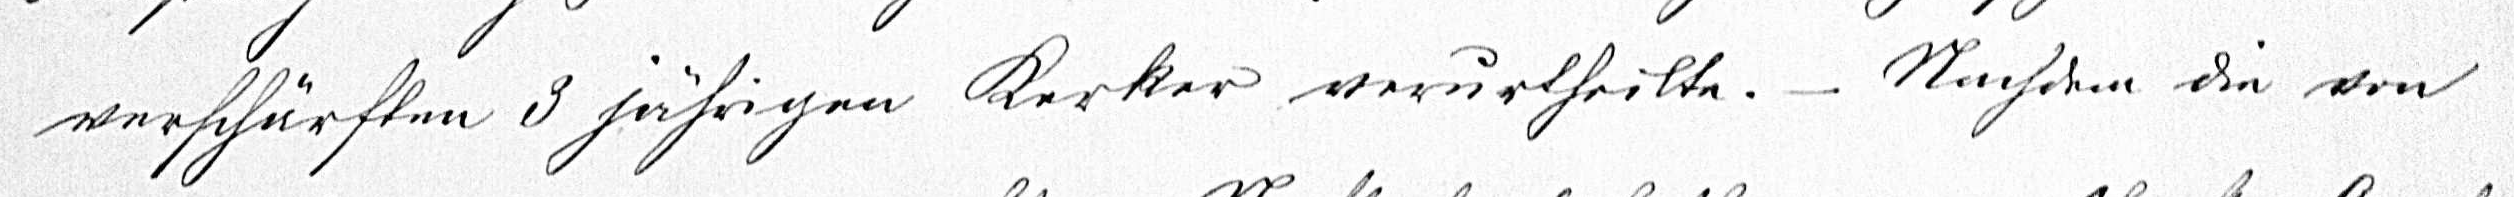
verschärften 3jährigen Kerker verurtheilte. Nachdem die von
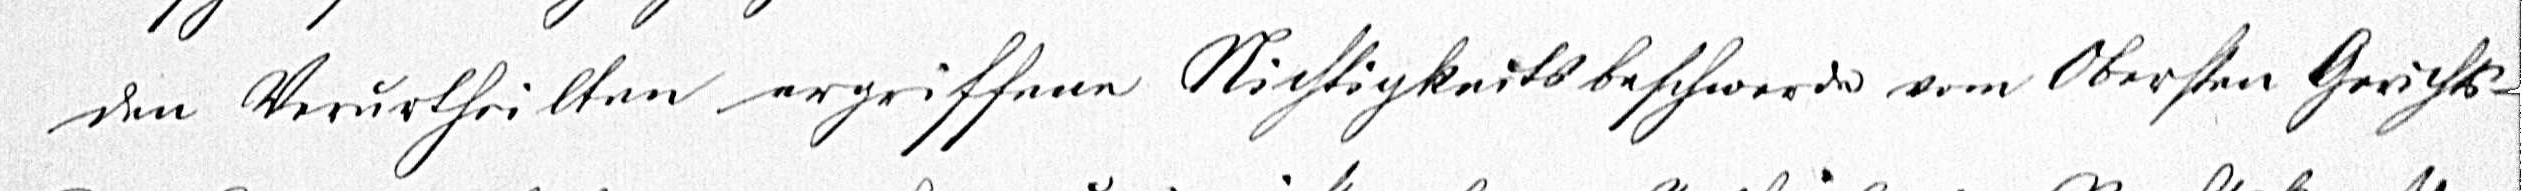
den Verurtheilten ergriffene Nichtigkeitsbeschwerde vom Obersten Gerichts-
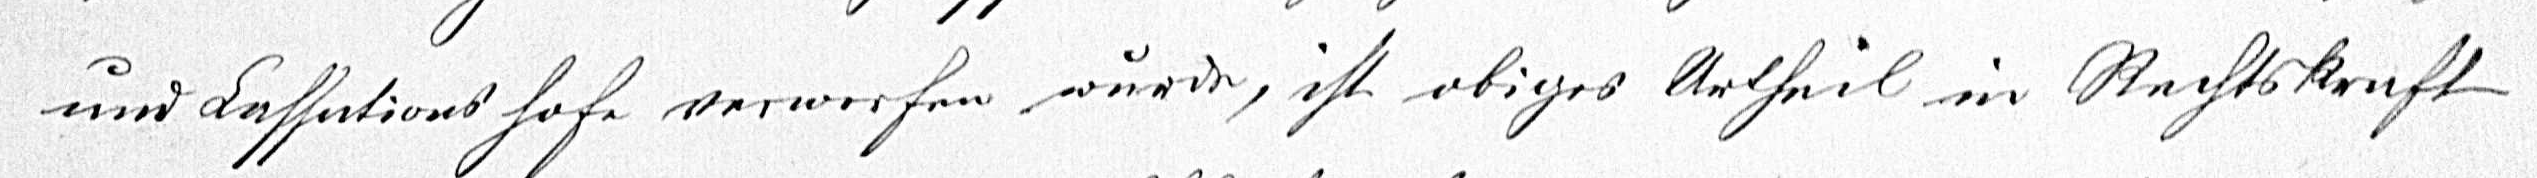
und Cassationshofe verworfen wurde, ist obiges Urtheil in Rechtskraft
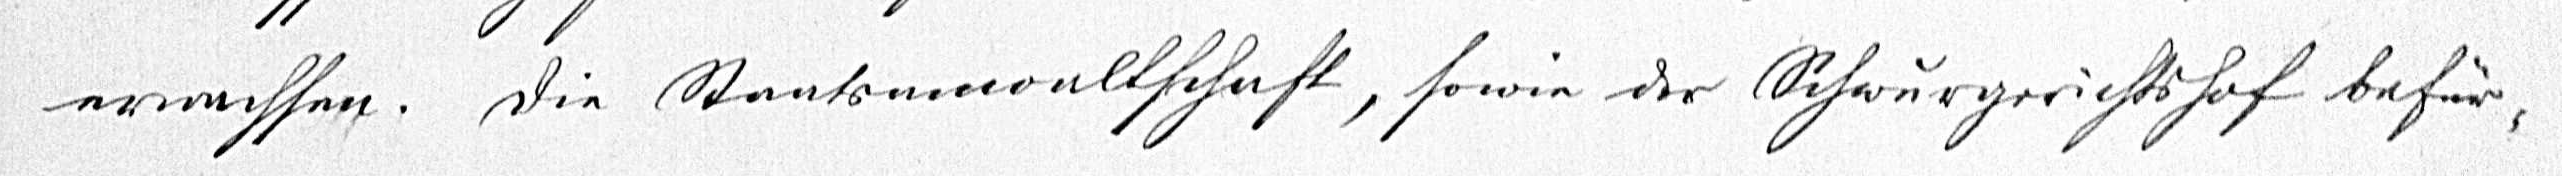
erwachsen. Die Staatsanwaltschaft, sowie der Schwurgerichtshof befür¬
